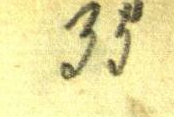35
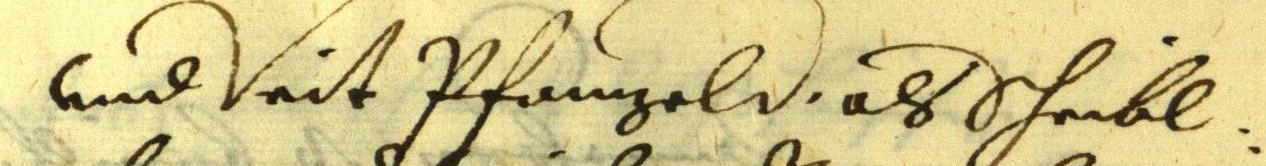vnd Veit Pfanzelt. als Scheibl¬
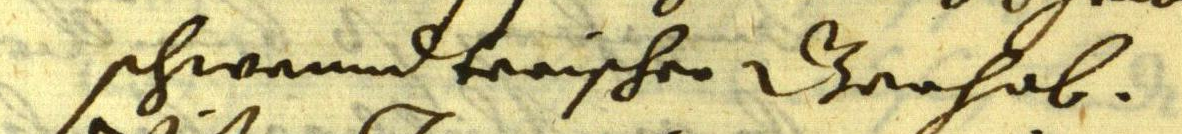schwenndterischer Gerhab.
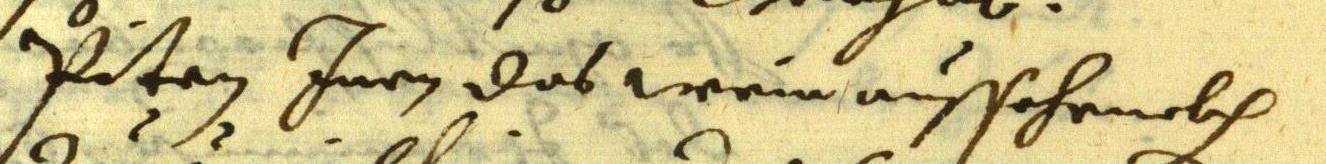Piten Inen das weinaūsschenckh
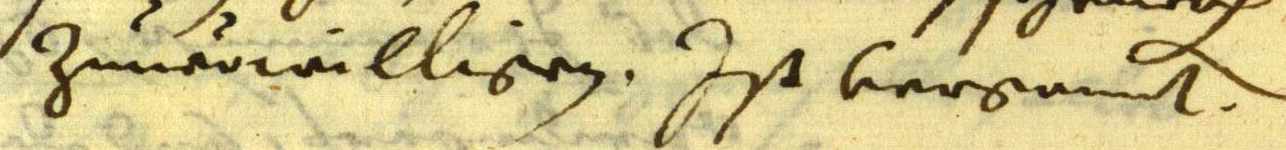Zūuērwilligen. Ist vergonnt.
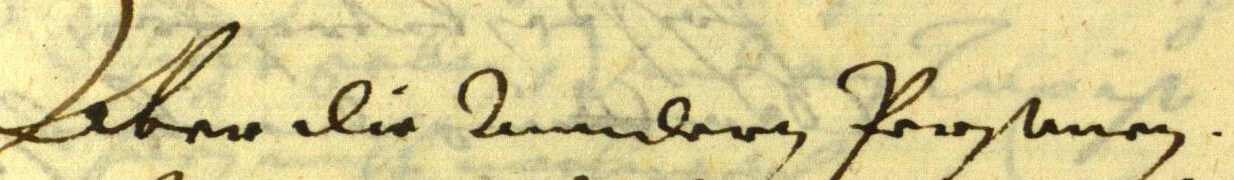Aber die Anndern Personen.
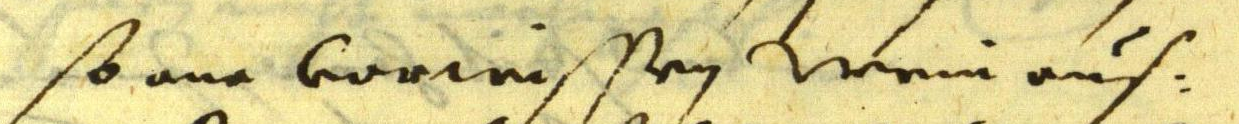So one vorwissen Wein aūs¬
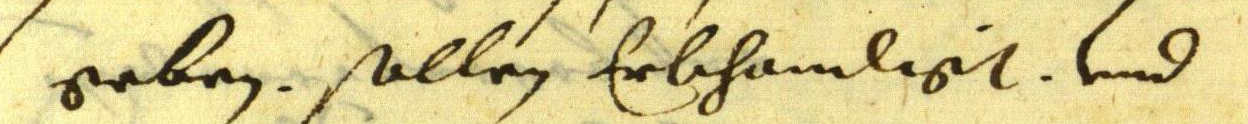geben. sollen Erkhondigt. vnd
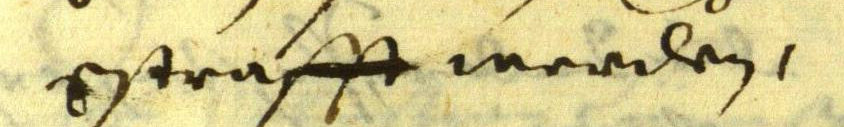gstrafft werden,
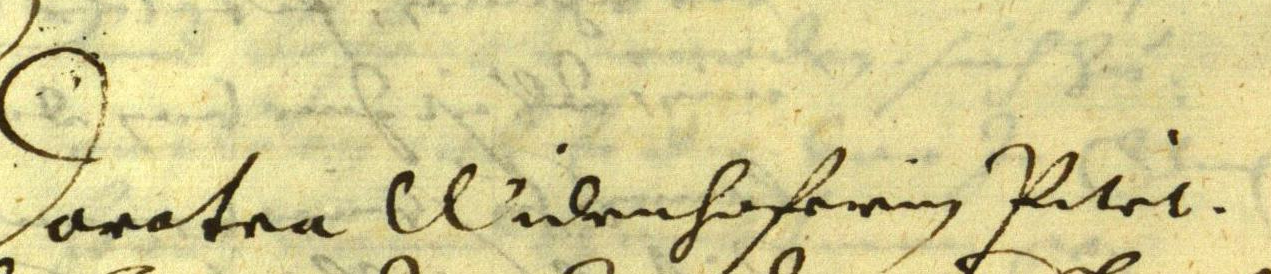Dorotea Widenhoferin Pitet.
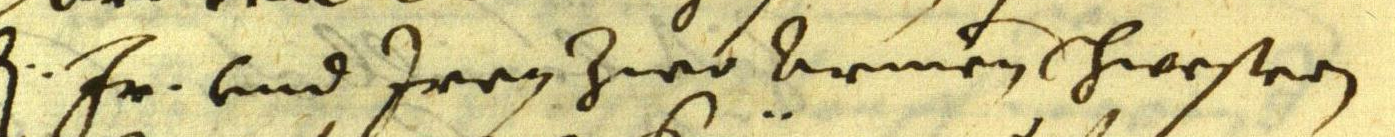Ir. vnd Iren Zwe Armen Schwestern
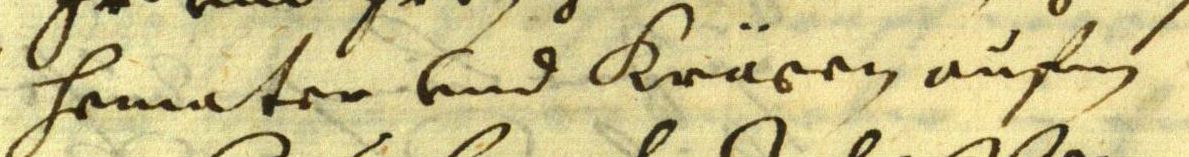Hemater vnd Krägen aūfm
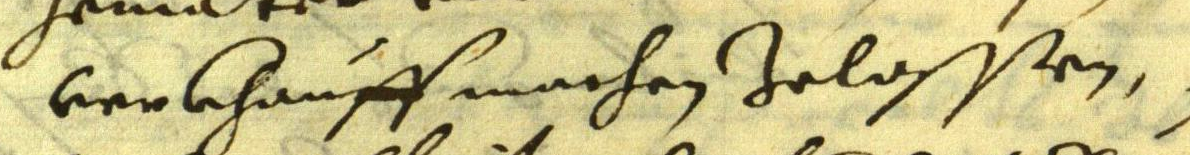verkhaūff machen Zelassen,
